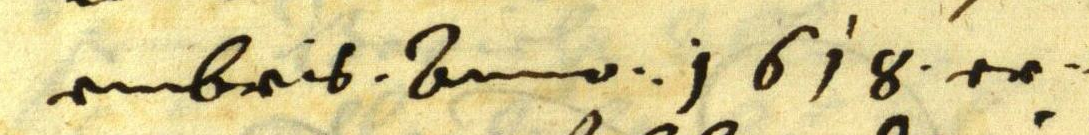embris. Anno: 1618. er¬
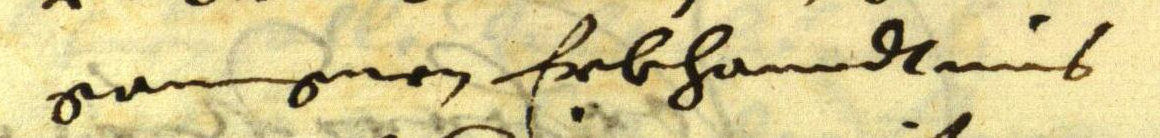ganngnen Erkhonndtnūs
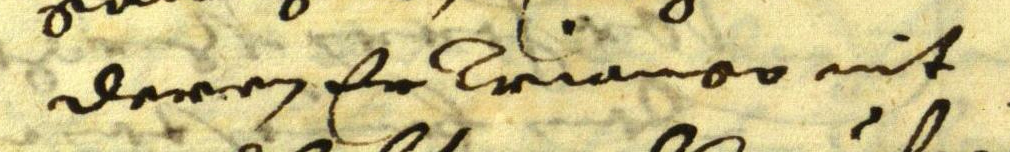deren Er Triango nit
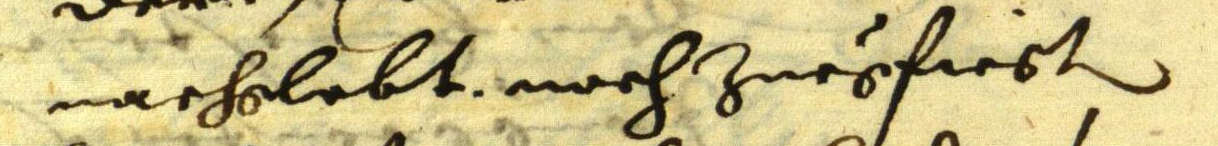nachglebt. noch Zūegfiegt
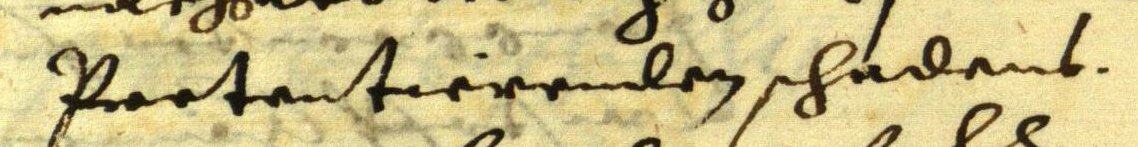Pretentierenden schadens.
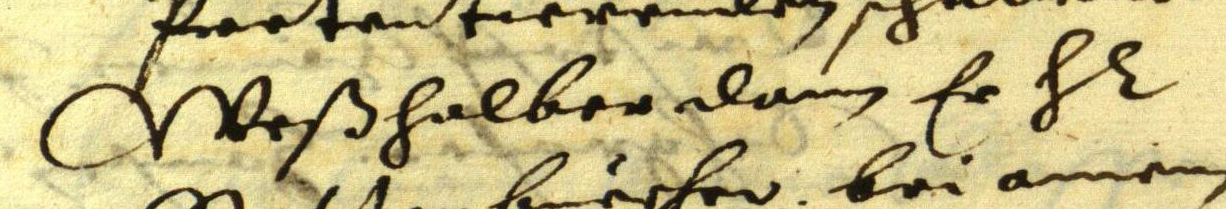Weßhalber dann Er hl
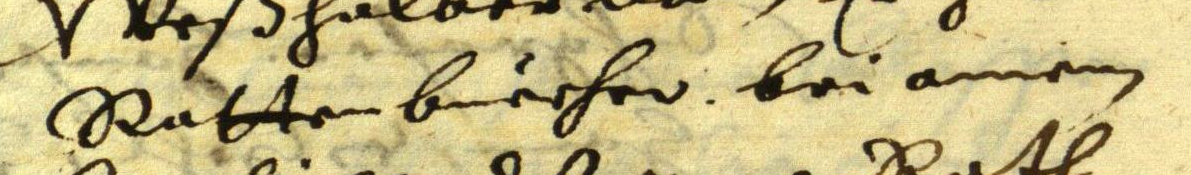Rottenbūecher. bei ainem
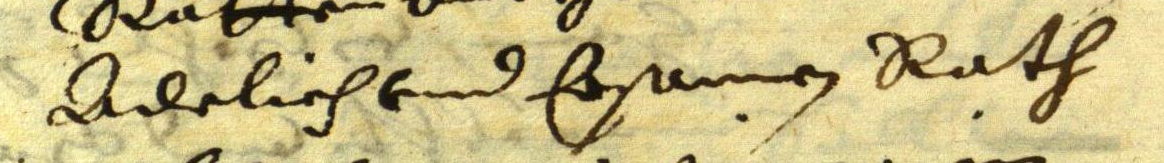Adelich vnd Ersamen Rath
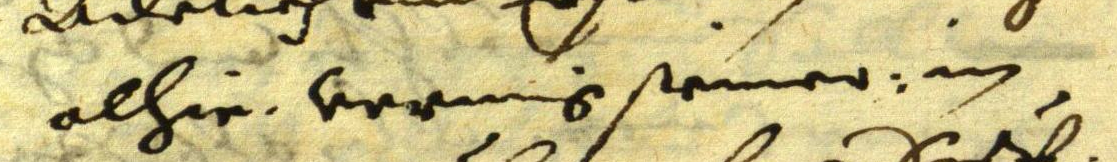alhie. vermig seiner: in
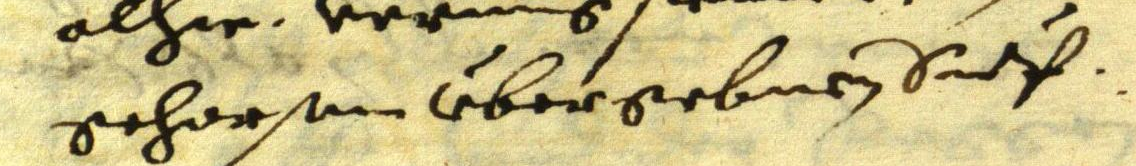gehorsam vbergebnen SūP¬
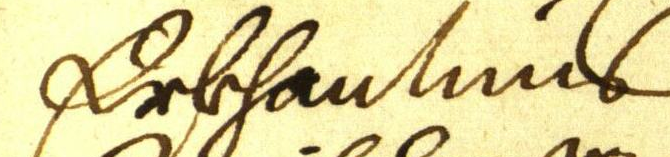Erkhantnūs
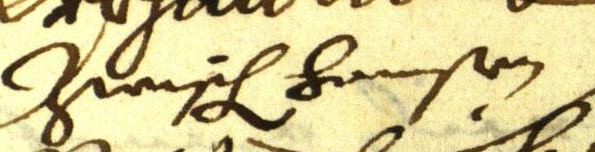Zwisch hansen
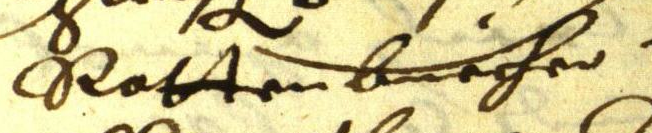Rottenbūecher
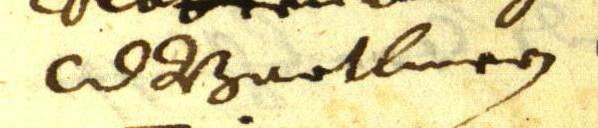vnd Bartlmeen
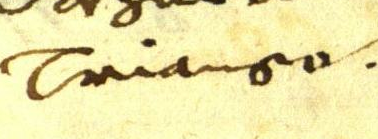Triango.
